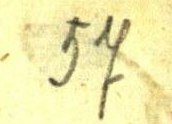57
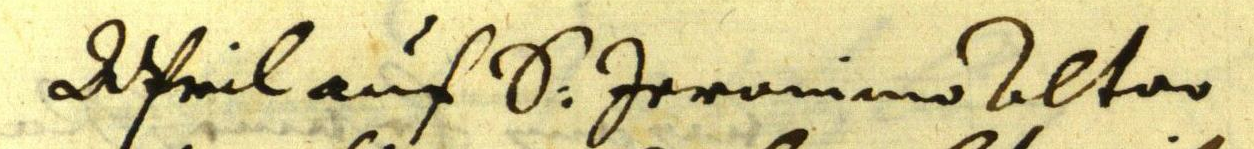April aūf S: Jeronimo Altar
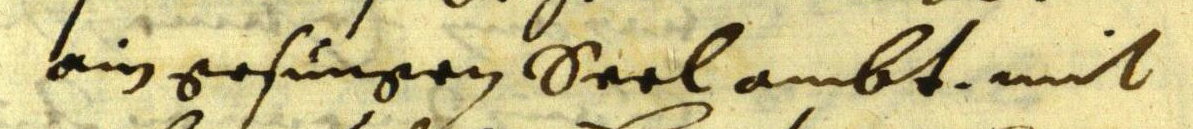ain gesūngen Seel ambt. mit
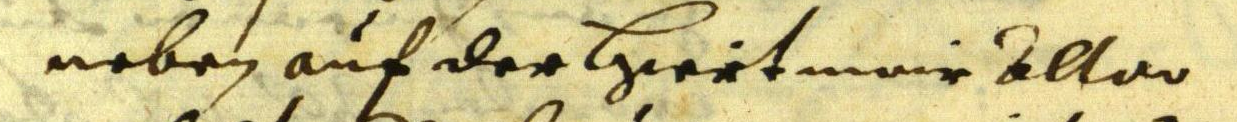neben aūf der Hiertmair Altar
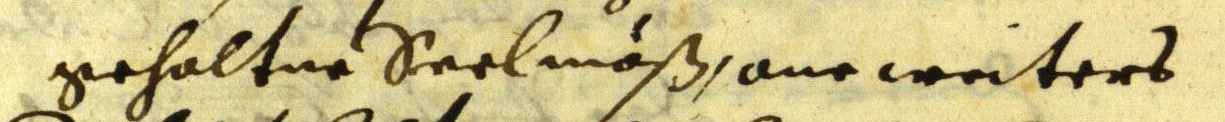gehaltne Seelmōß, one weiters
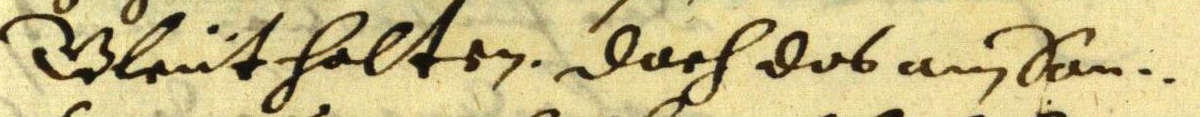Gleüt halten. doch das am Son¬
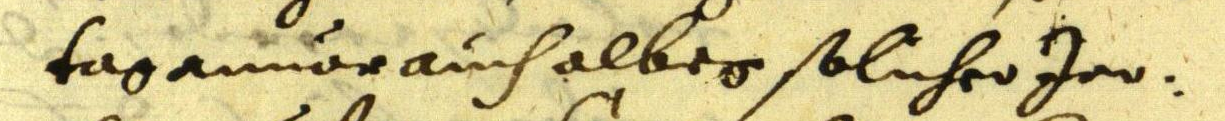tag anūor aūch albeg solicher Jar¬
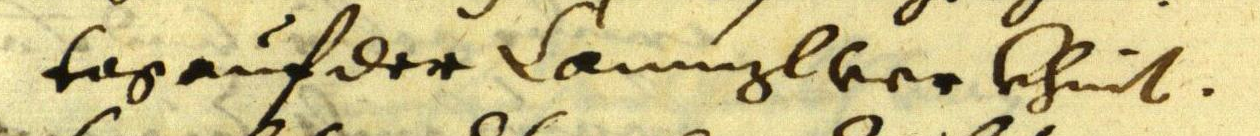tag aūf der Cannzl ver khūt.
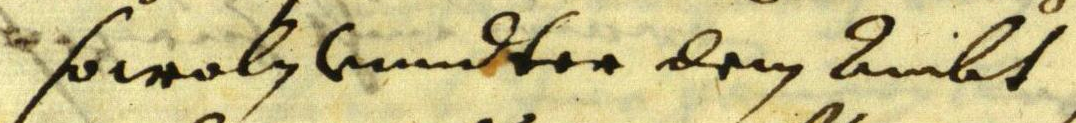so woln vndter dem Ambt
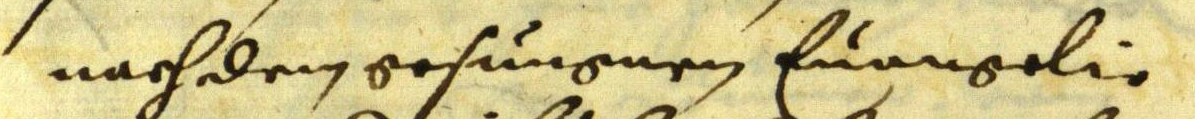nach dem gesūngnen Evangelie
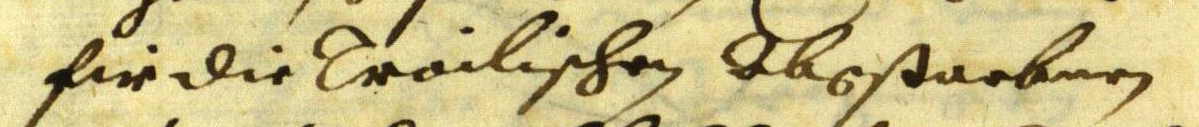fir die Troilischen Abgstorbnen
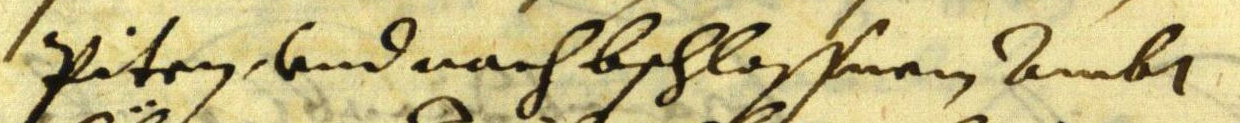Piten, vnd nach beschlossnem Ambt
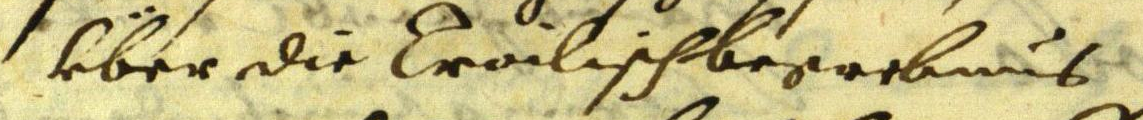v̈ber die Troilisch begrebūng
